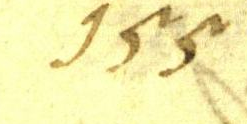155
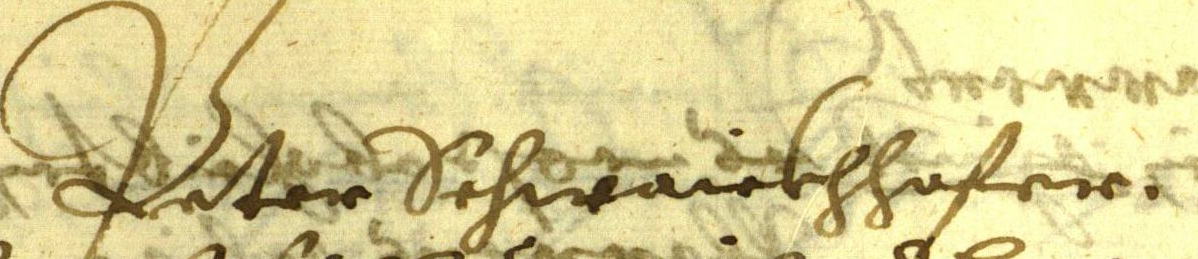Peter Schwaickhhofer.
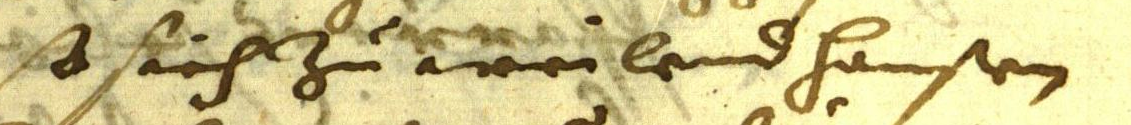so sich Zū weilend Hansen
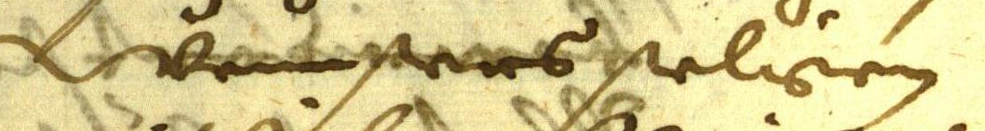Wennsers seligen
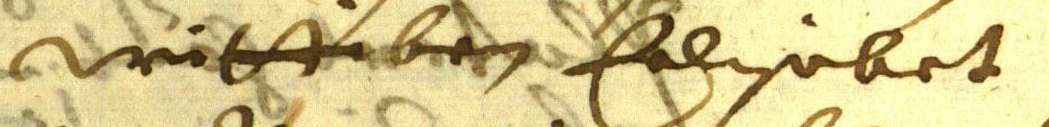Wittiben Elisabet
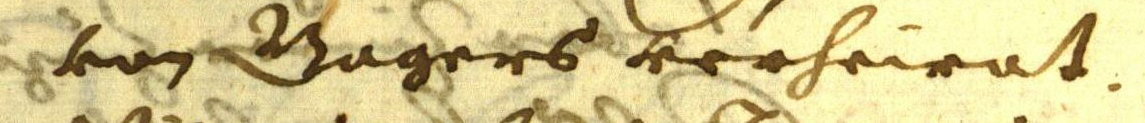von Gagers verheirat.
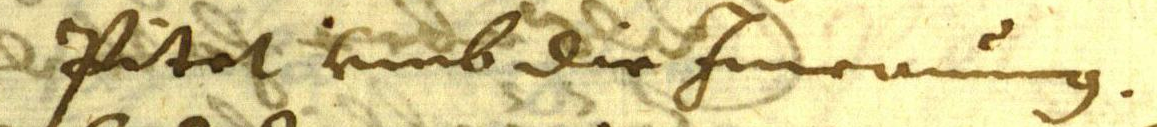Pitet vmd die Inwonūng.
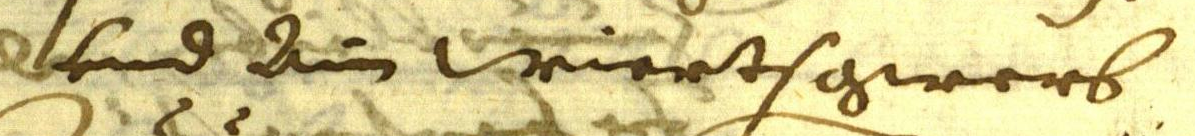vnd Ain wiertsgwerb
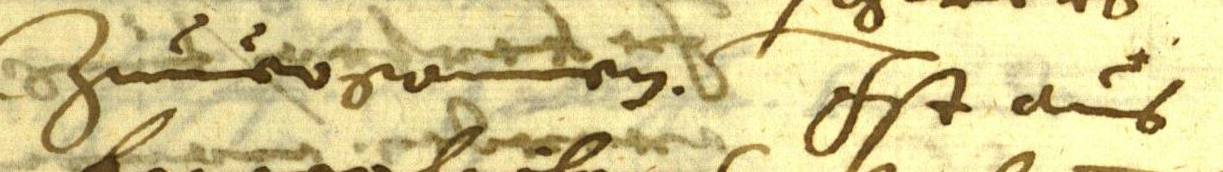Zūūergonnen. Ist aūs
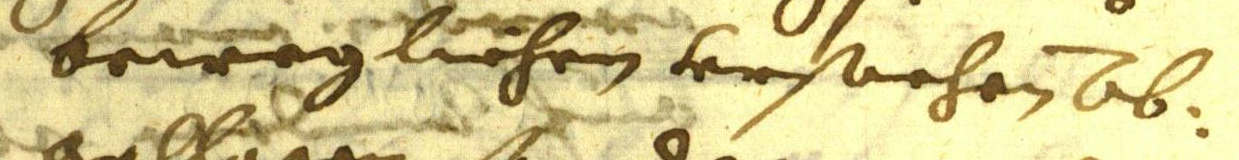beweglichen vrsachen Ab¬
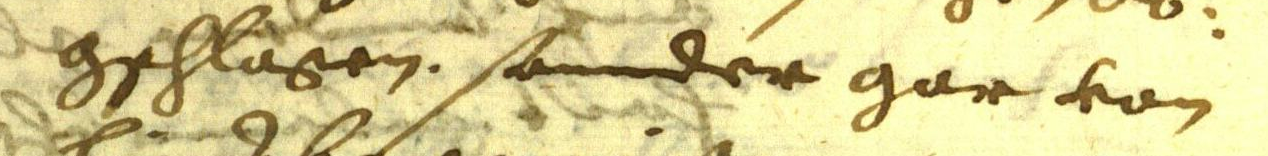gschlagen. sonnder gar von
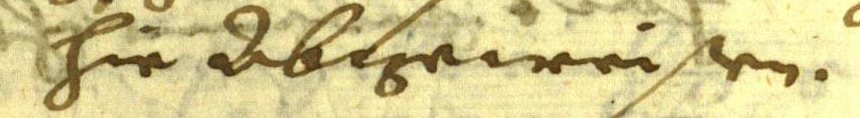hie Abzeweisen.
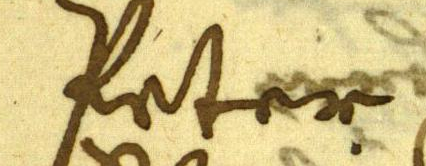Peter
